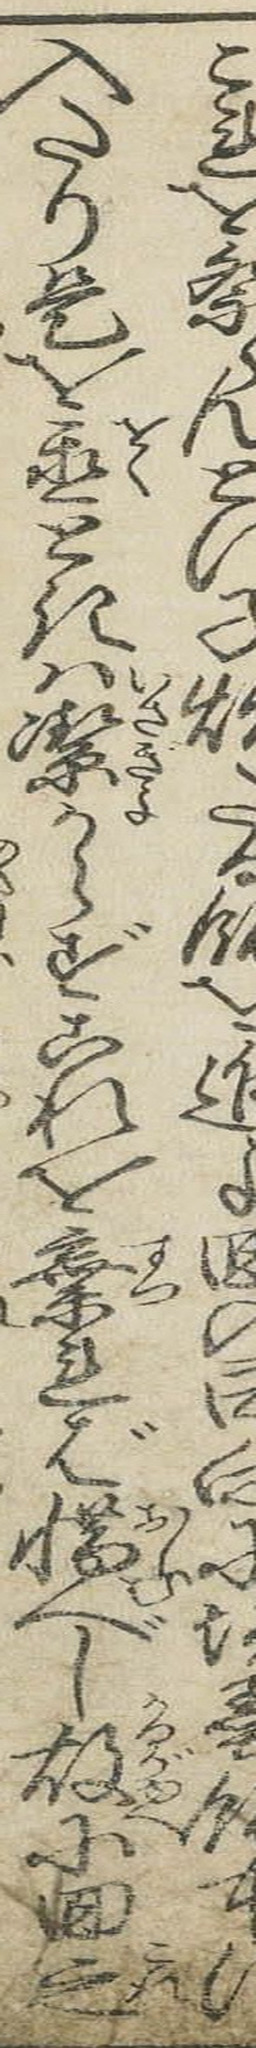入たり是を置ときは潔からずこれを棄れば惜べし故に回之
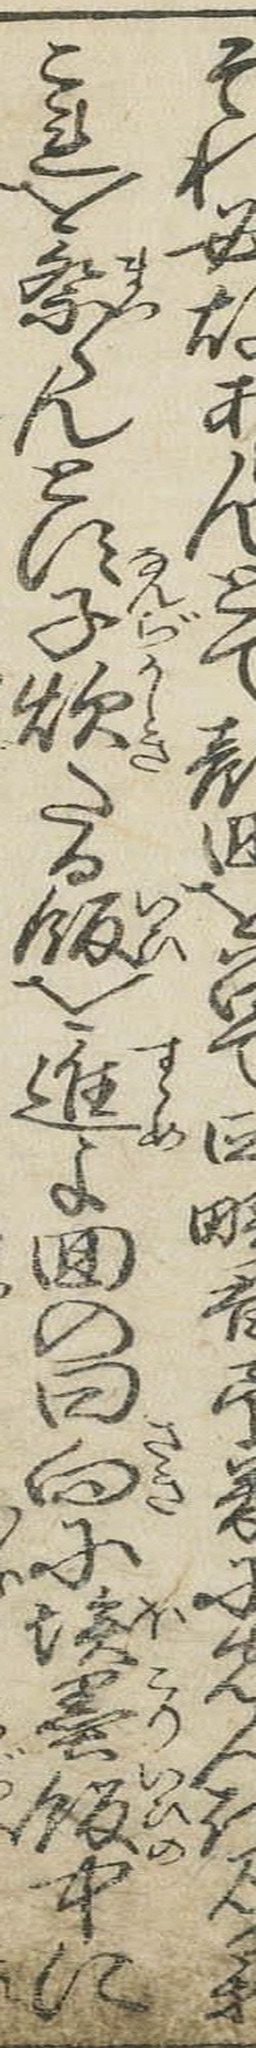これを祭らんとす子炊たる飯を進よ回の曰向に埃墨飯中に
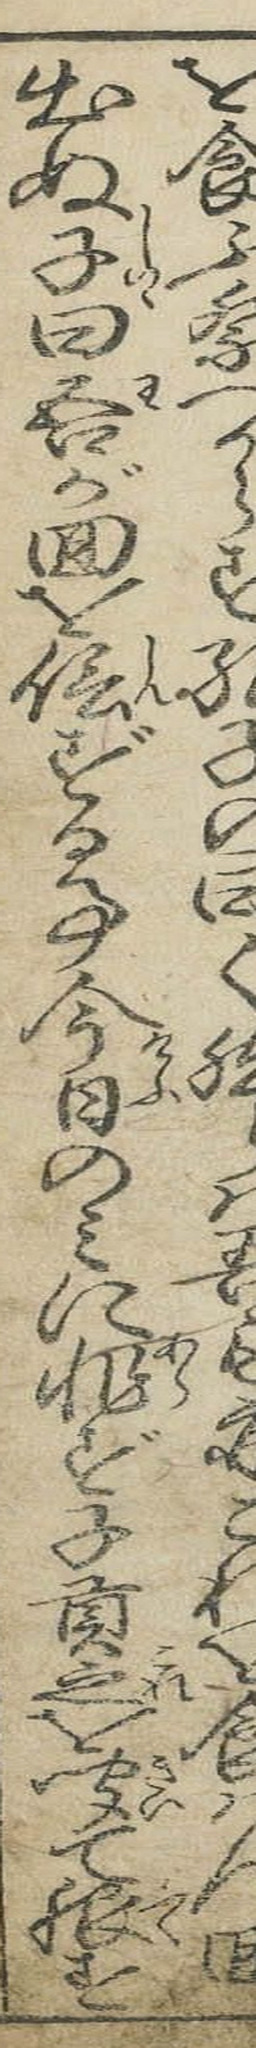出ぬ子曰吾が回を信ずる事今日のみに非ず子貢之を聞て服す
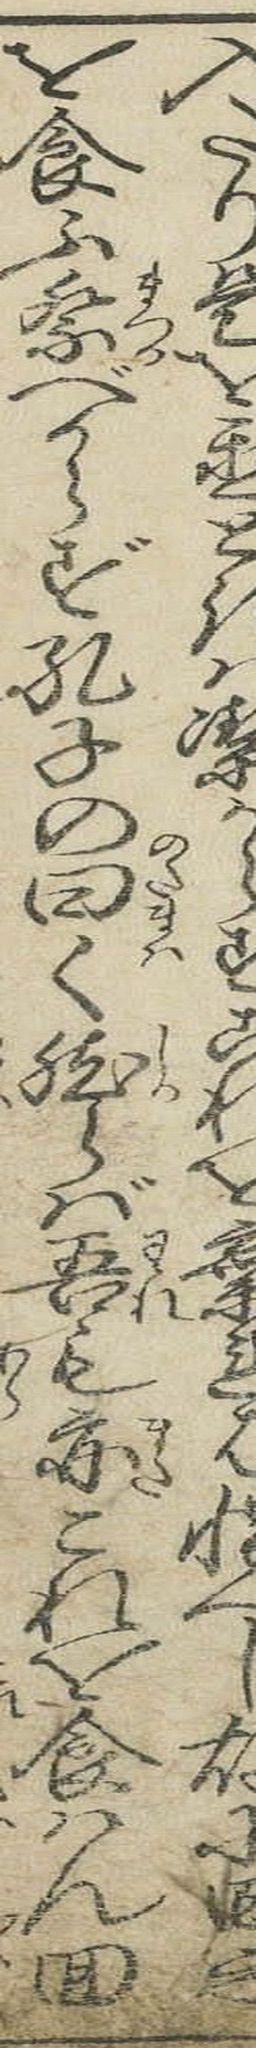を食ふ祭べからず孔子の曰く然らば吾も亦これを食はん回

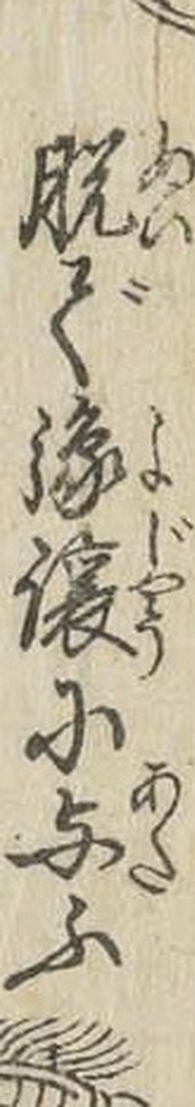脱で予譲に与ふ
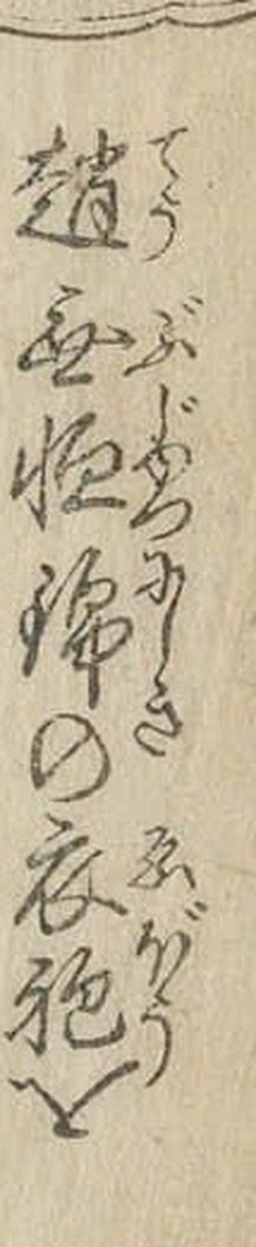趙無恤錦の衣袍を
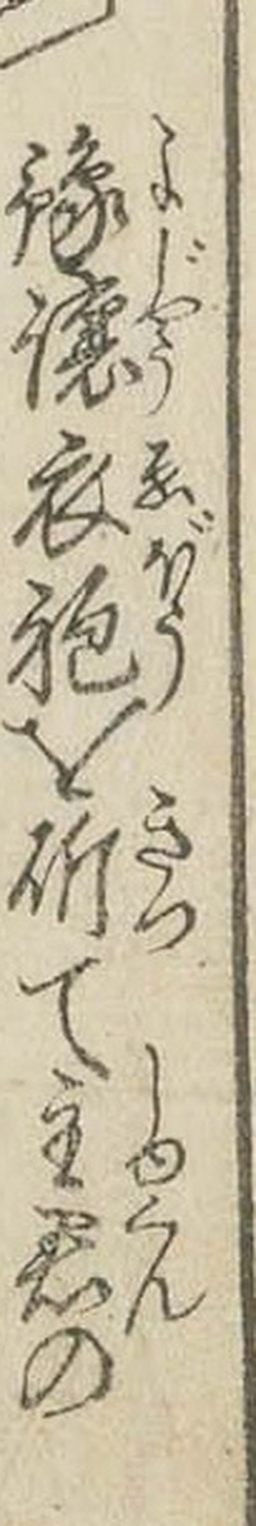予譲衣袍を斫て主君の
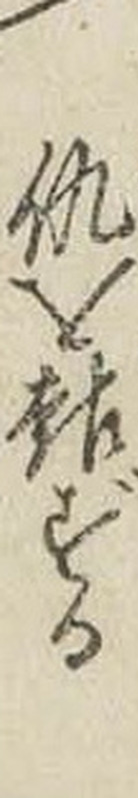仇を報ずる
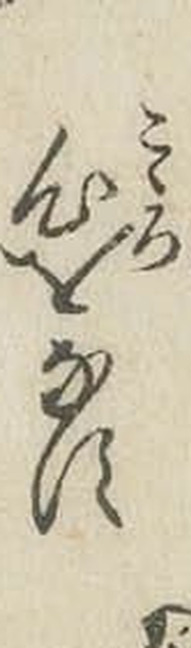心をなす

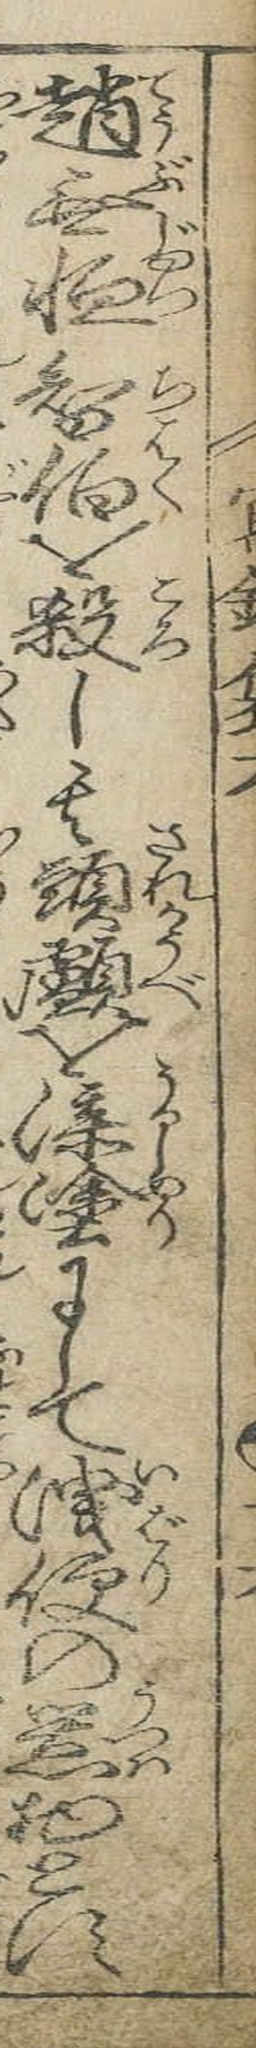趙無恤智伯を殺し其頭顱を漆塗にして洩便の器物とす
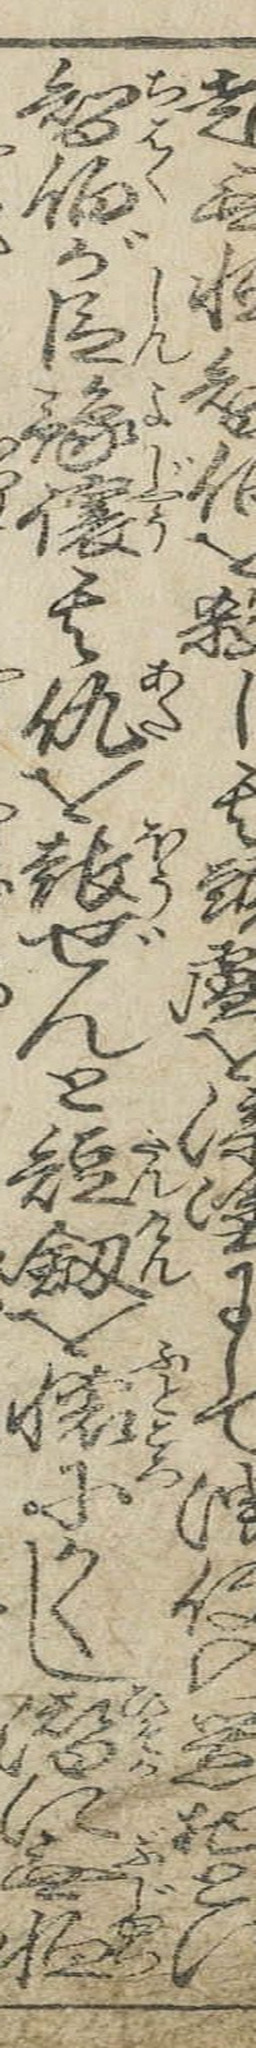智伯が臣予譲其仇を報ぜんと短剣を懐にかくし潜に無恤
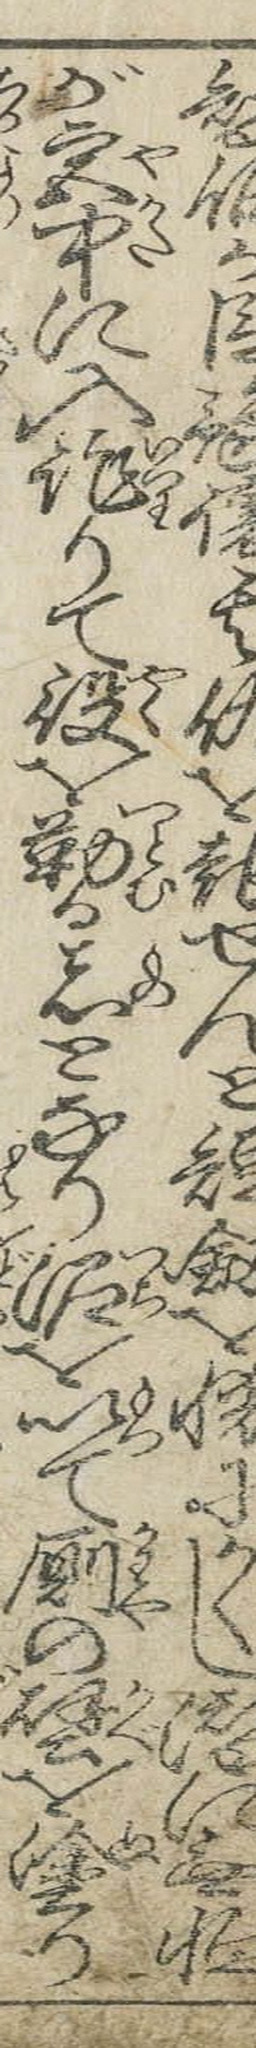が宮中に入詐りて役を勤る者となり泥を以て厠の壁を塗り
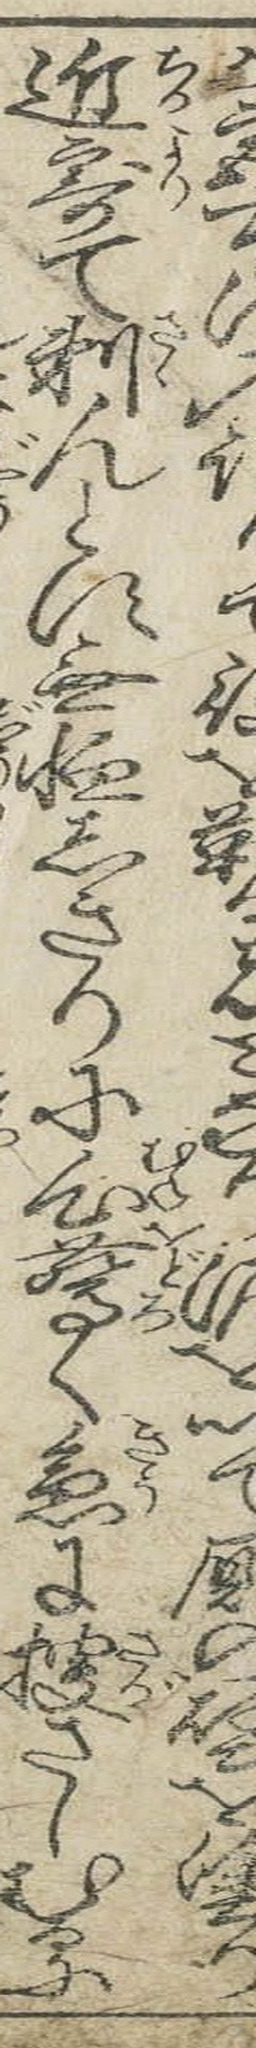近寄て刺んとす無恤しきりに心驚く急に捜さしむるに
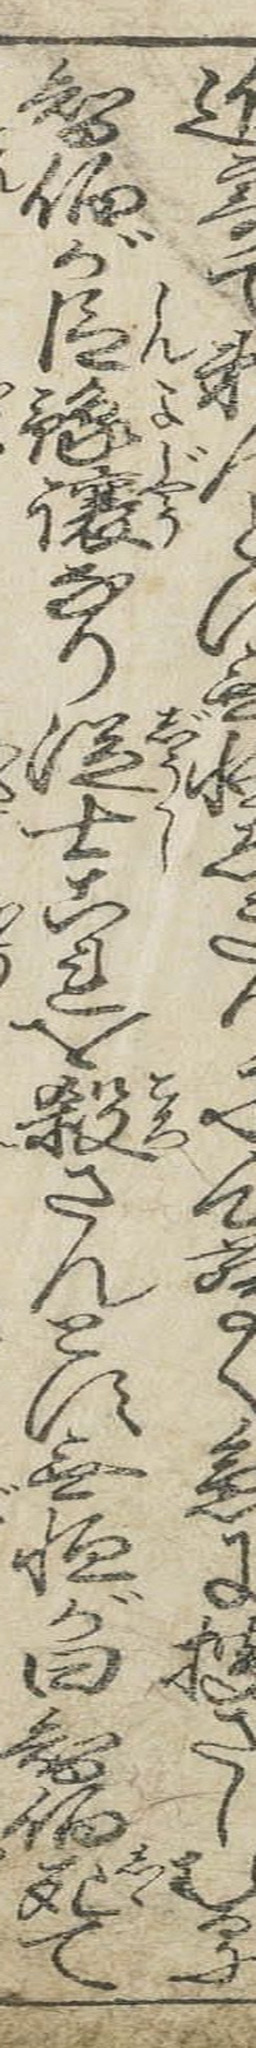智伯が臣予譲なり従士これを殺さんとす無恤が曰智伯死て
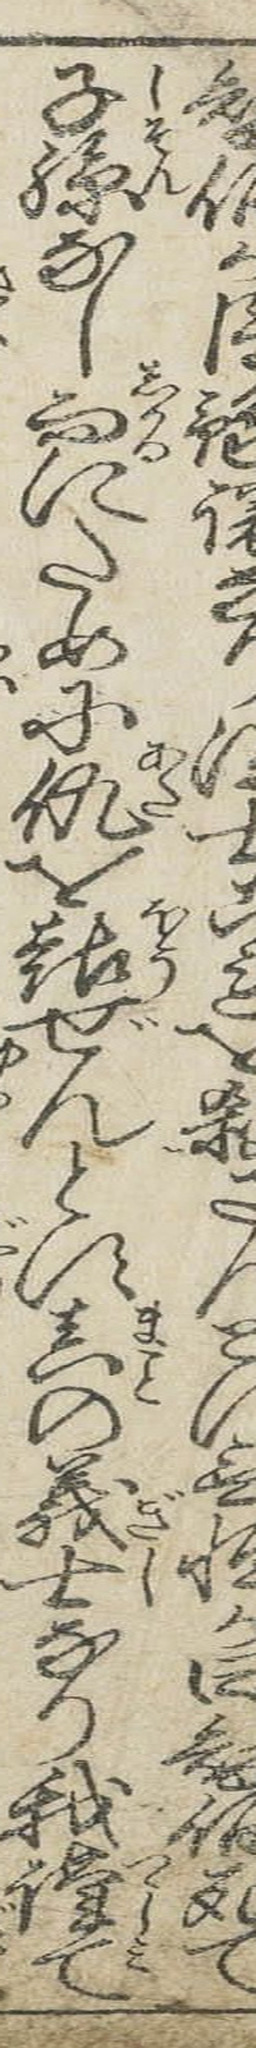子孫なし而にために仇を報ぜんとす真の義士なり我謹て
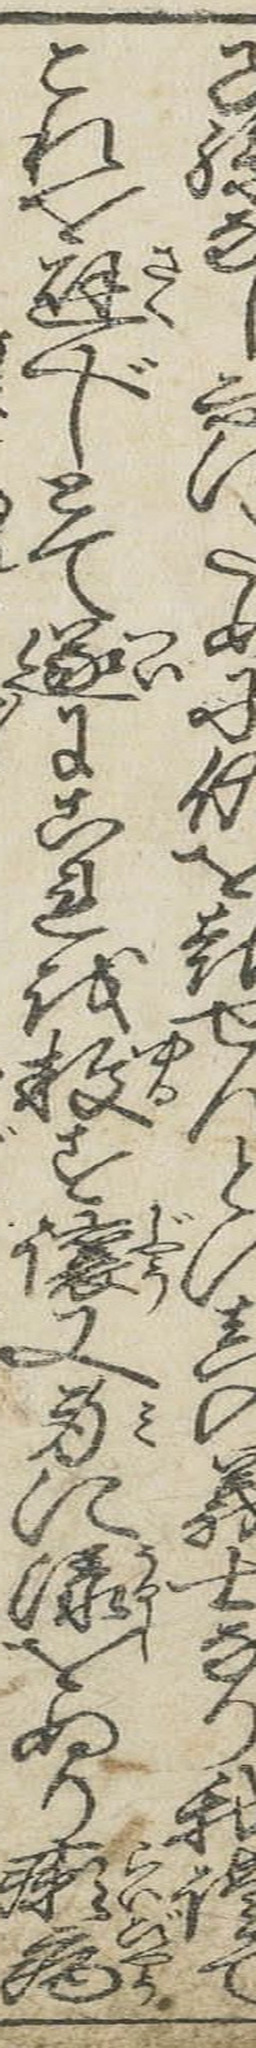これを避べしとて遂にこれを赦す譲亦身に漆をぬり癩病
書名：絵本写宝袋 9巻 6之巻
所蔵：東京学芸大学教育コンテンツアーカイブ
